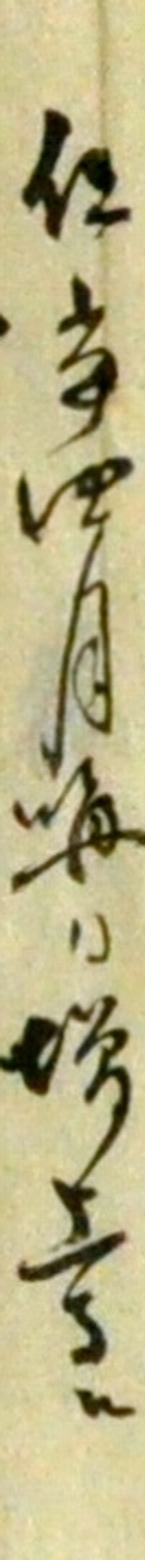但当四月晦日増上寺江
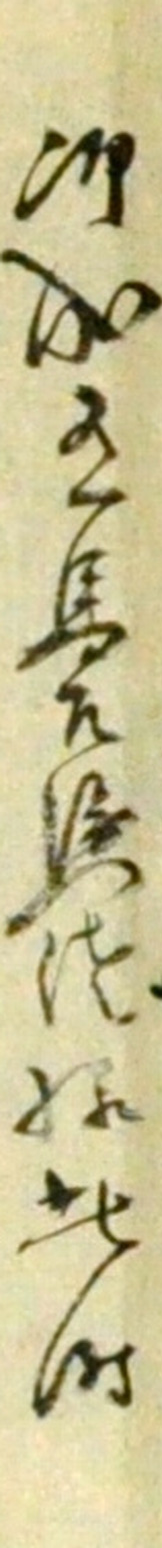御成有馬左衛門佐様此時
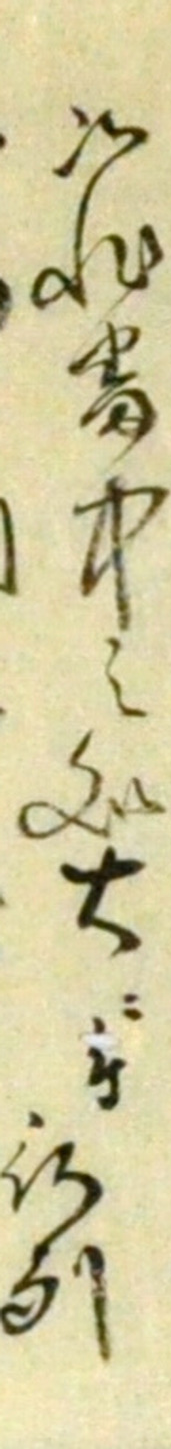御非番中之処右ニ付行列
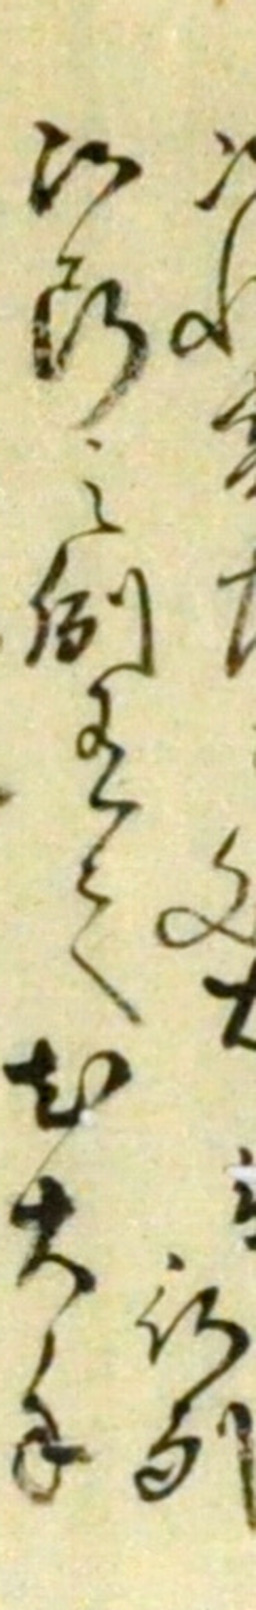御断之例有之尤大手
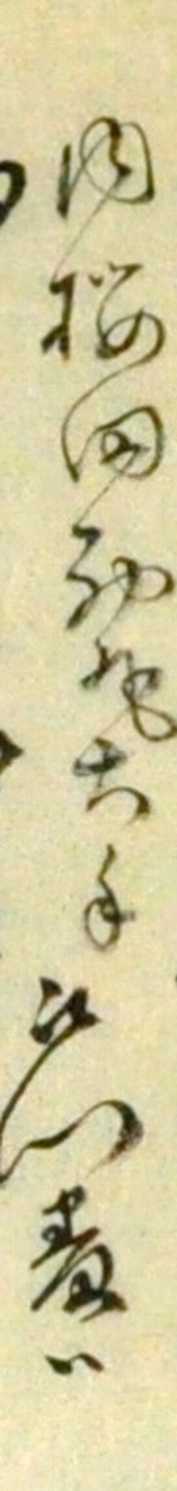内桜田西丸大手御門番ハ
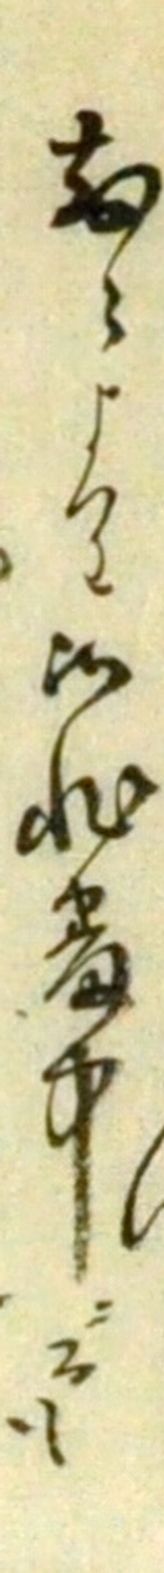前々より御非番中ニ而も
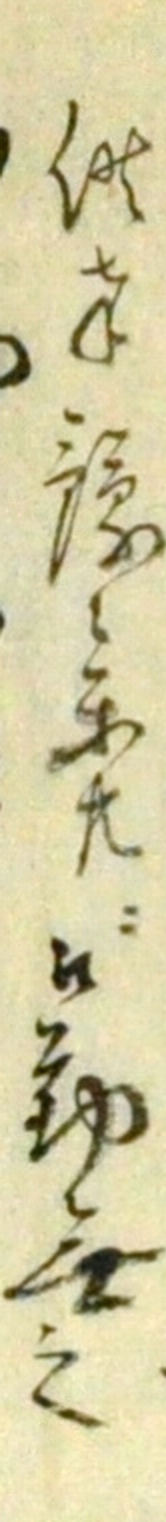供奉予参共ニ御勤無之
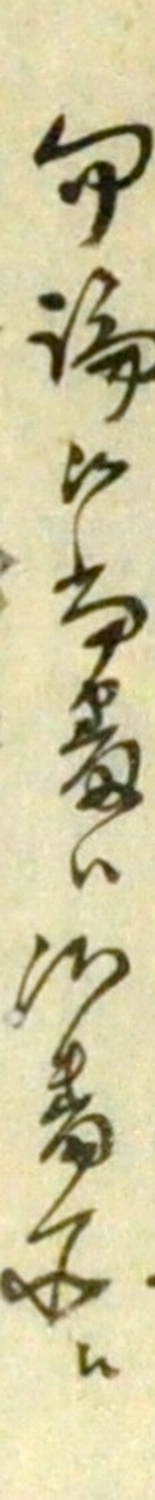勿論御当番ハ番所江
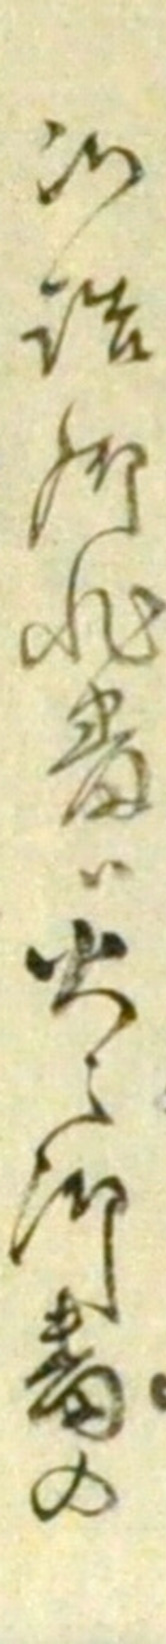御詰御非番ハ火之御番の
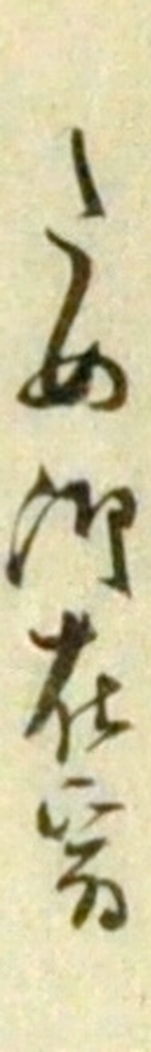ため御在宿
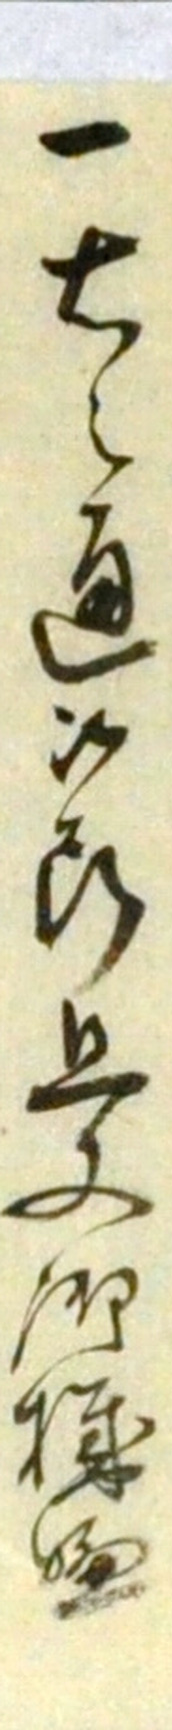一右之通御断且又御機嫌
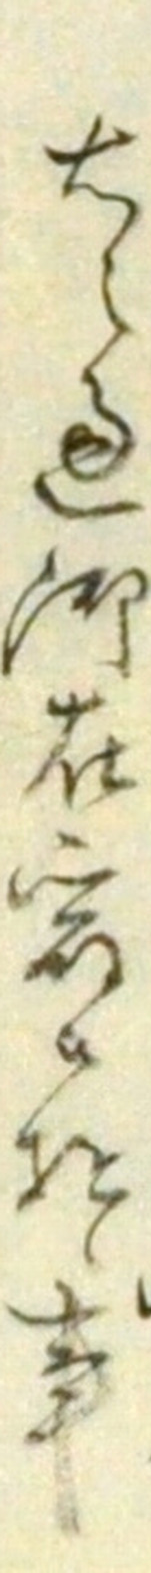右之通御在宿被遊候事
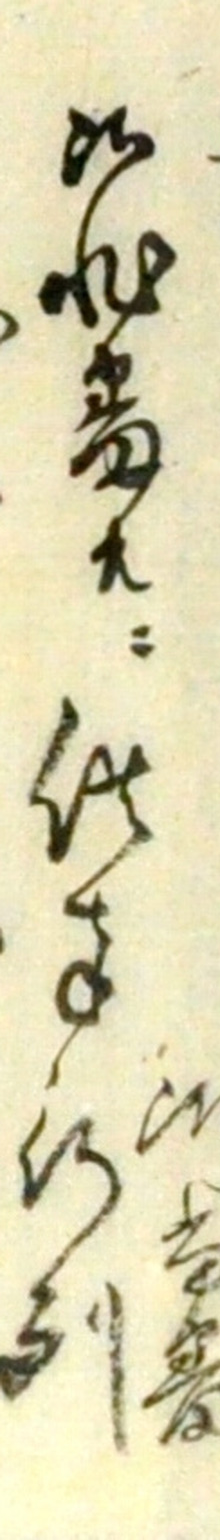御非番共ニ供奉行列
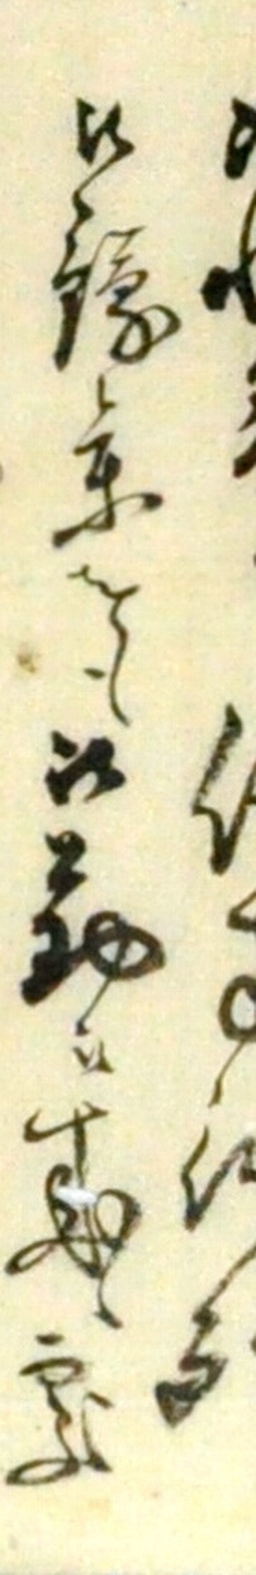御予参をも御勤被成候処
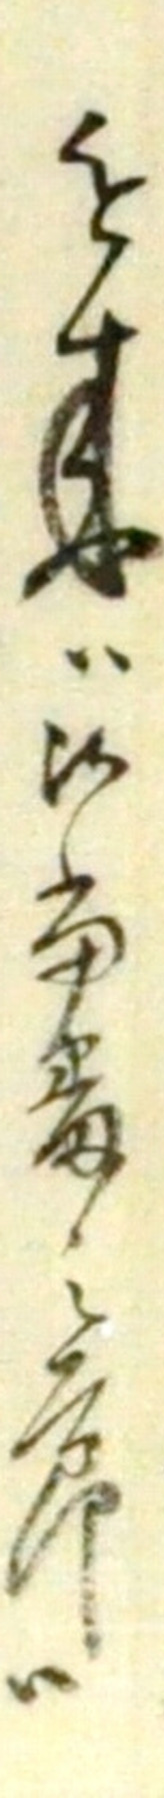近来は御当番之節ハ
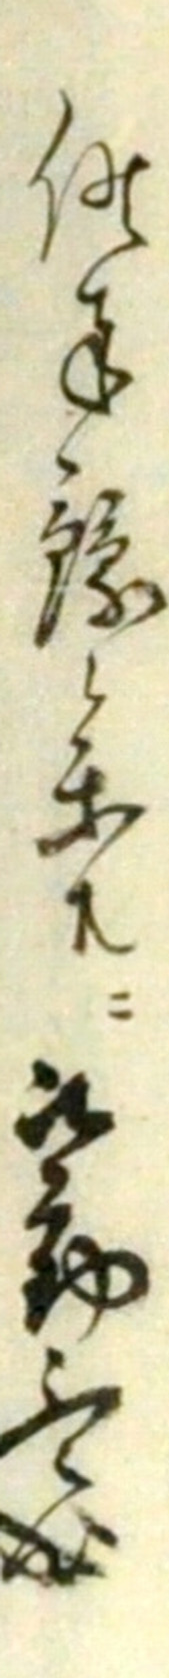供奉予参共ニ御勤不被成
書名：覚
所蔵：伊那市立高遠町図書館・合同会社AMANE
